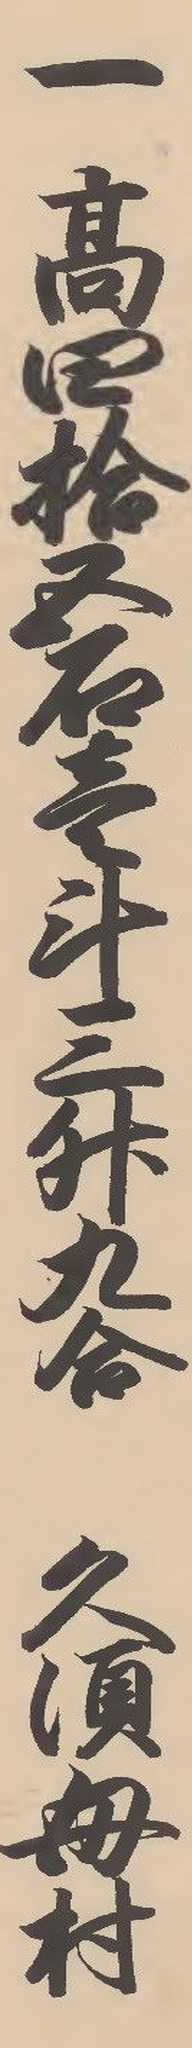一高四拾五石壱斗三升九合久須母村
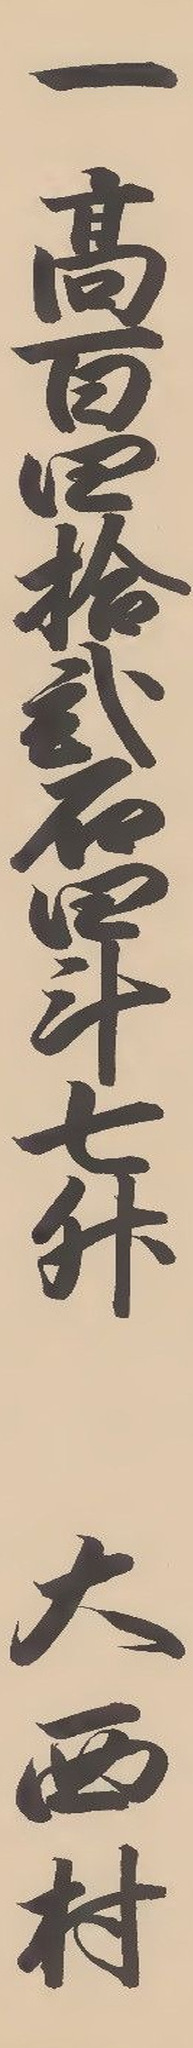一高百四拾弐石四斗七升大西村
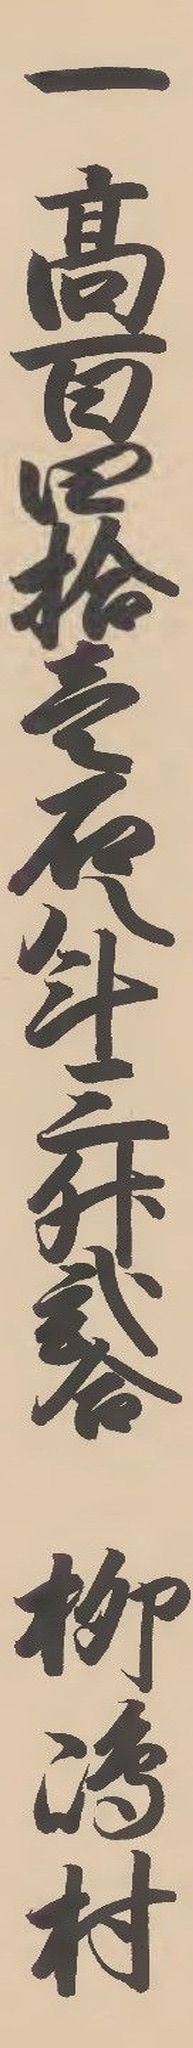一高百四拾壱石八斗三升弐合柳島村
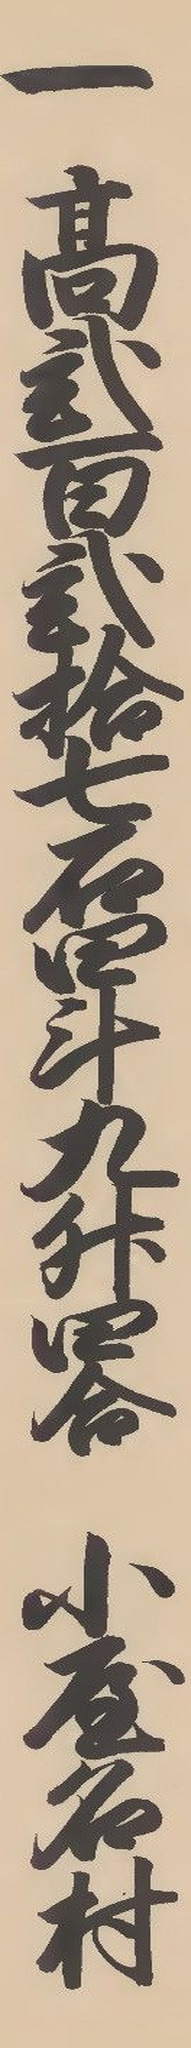一高弐百弐拾七石四斗九升四合小屋名村
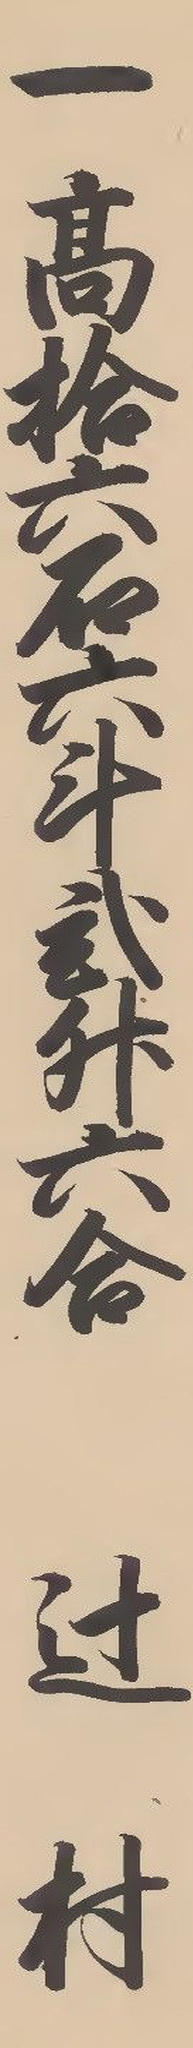一高拾六石六斗弐升六合辻村
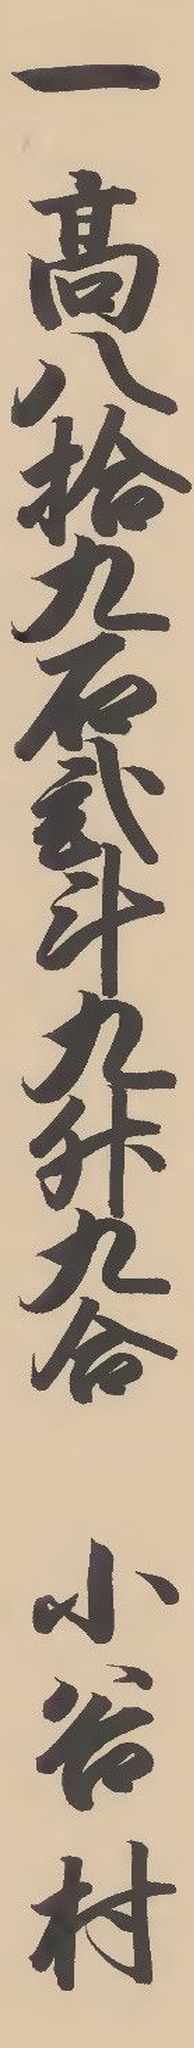一高八拾九石弐斗九升九合小谷村
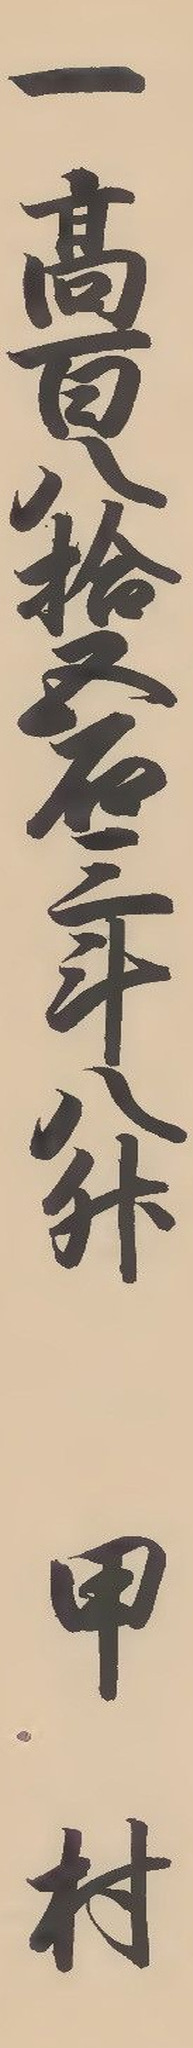一高百八拾五石三斗八升甲村

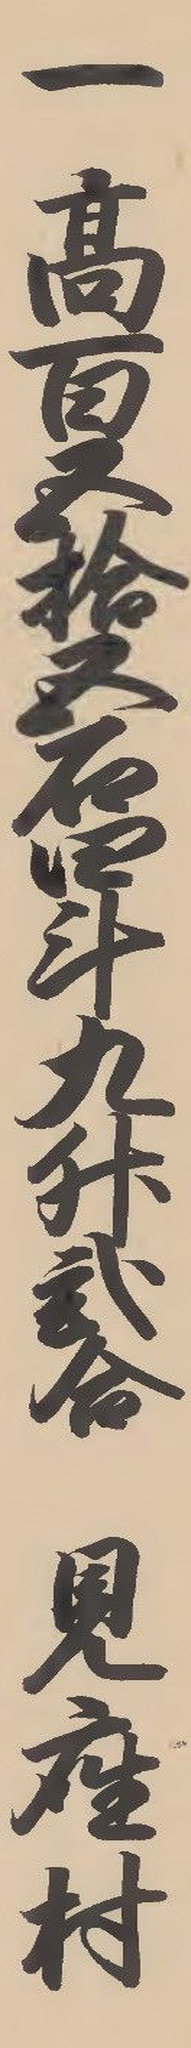一高百五拾五石四斗九升弐合見座村
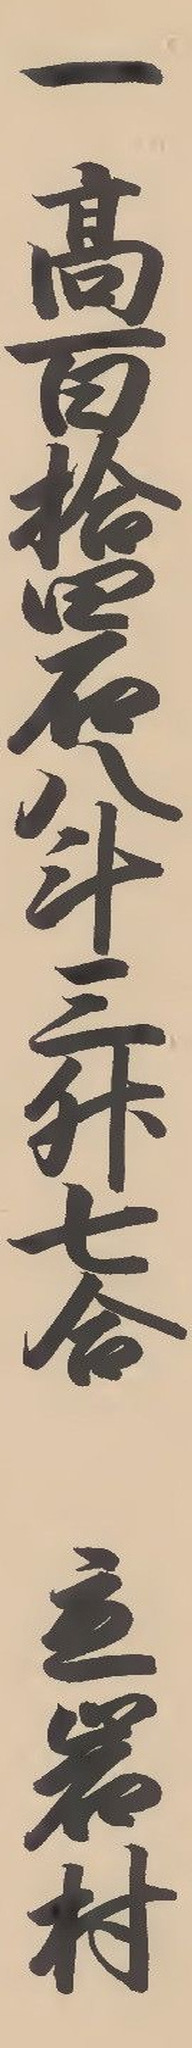一高百拾四石八斗三升七合立岩村
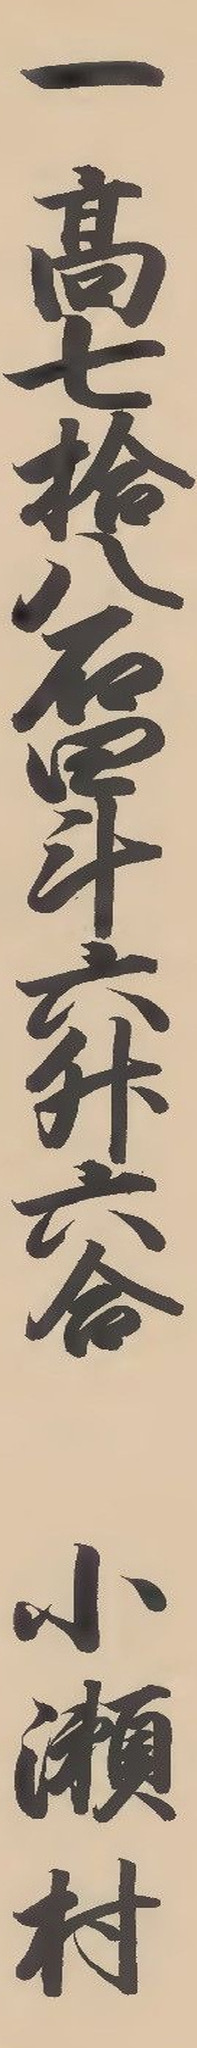一高七拾八石四斗六升六合小瀬村
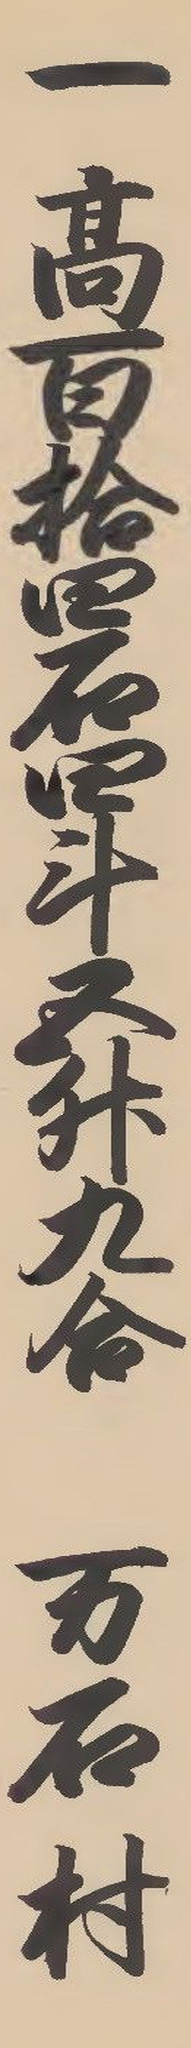一高百拾四石四斗五升九合万石村
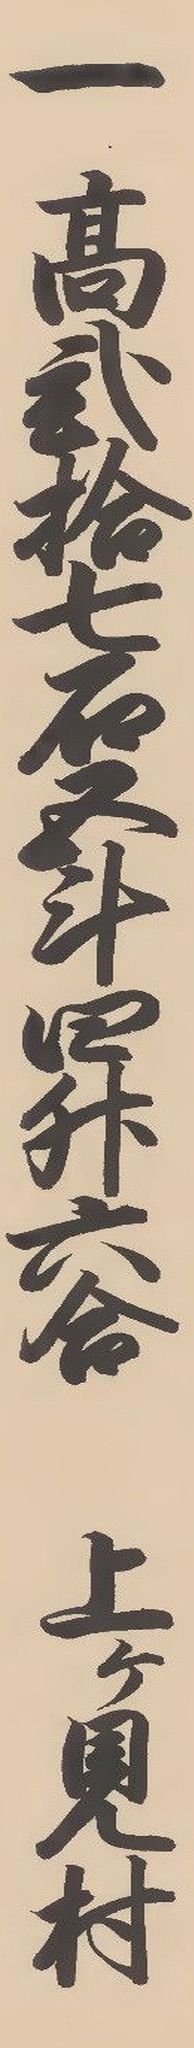一高弐拾七石五斗四升六合上ヶ見村
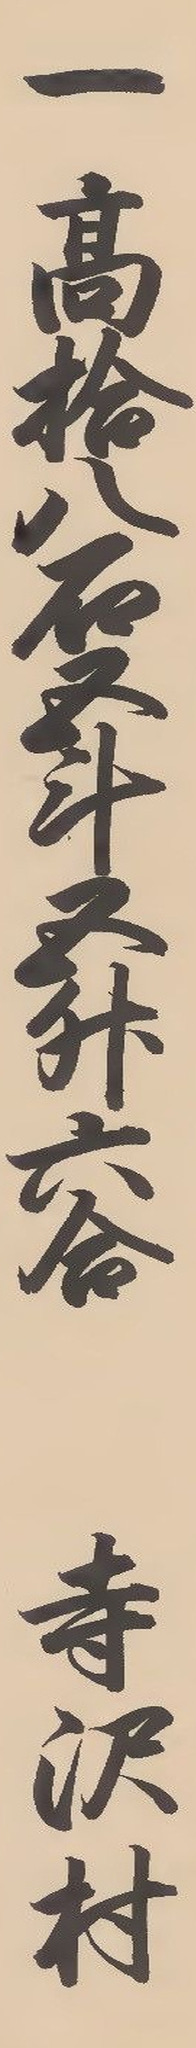一高拾八石五斗五升六合寺沢村
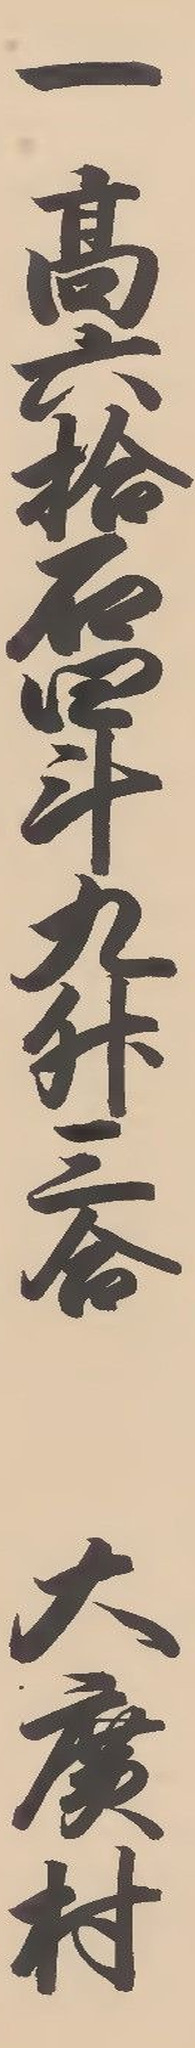一高六拾石四斗九升三合大広村
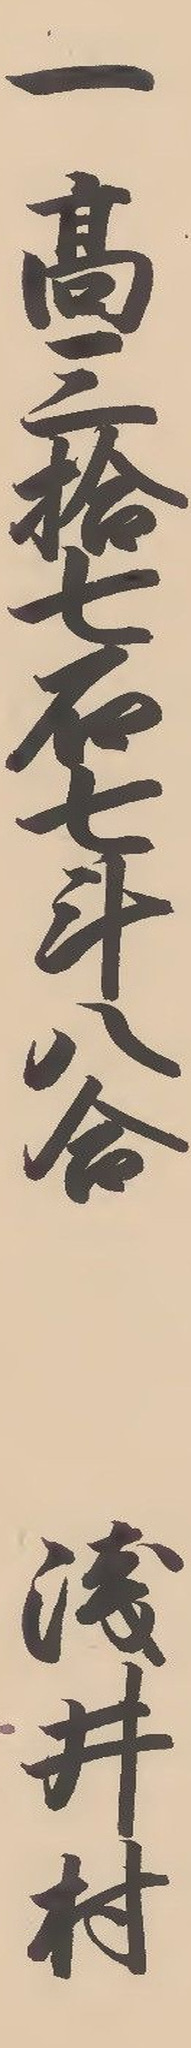一高三拾七石七斗八合浅井村

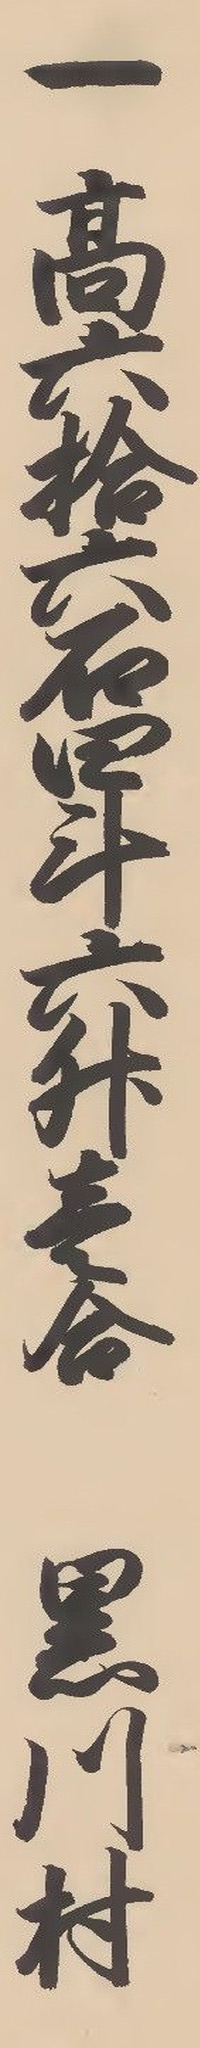一高六拾六石四斗六升壱合黒川村
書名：飛騨国郷帳
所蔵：国立公文書館 National Archives of Japan
